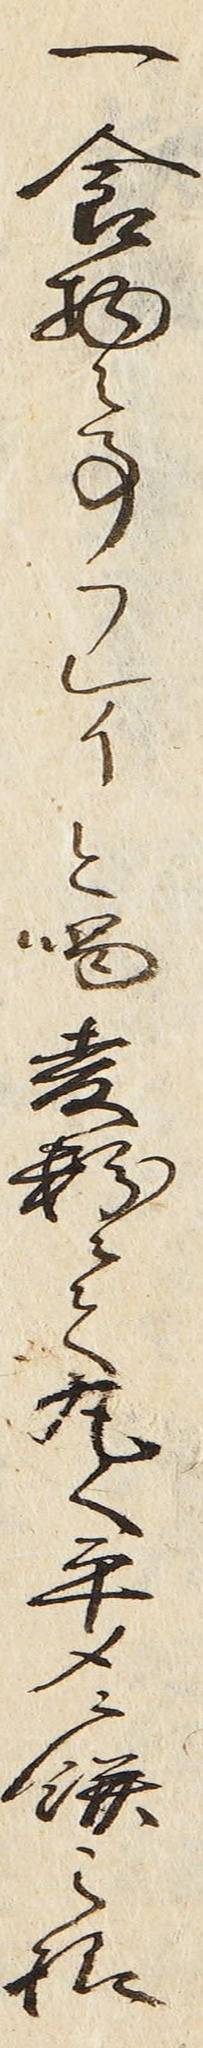一食物之事フレイと唱麦粉にて丸く平めに餅之様
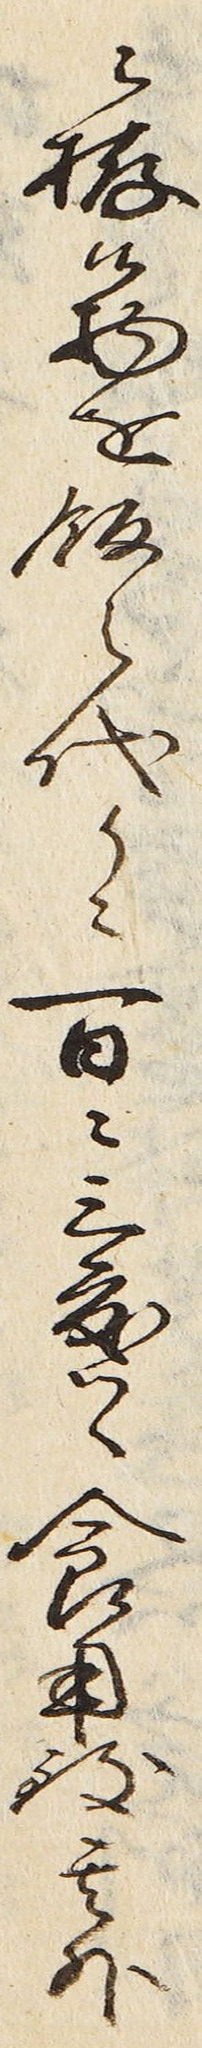に拵候物を飯之代りに一日に三度ツヽ食用致其外
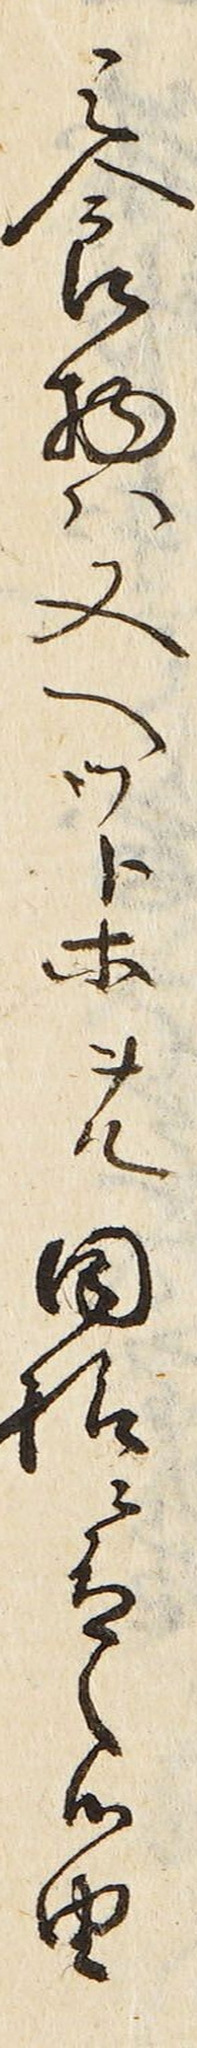之食物はヌヘツトホヲル同様に有之候由
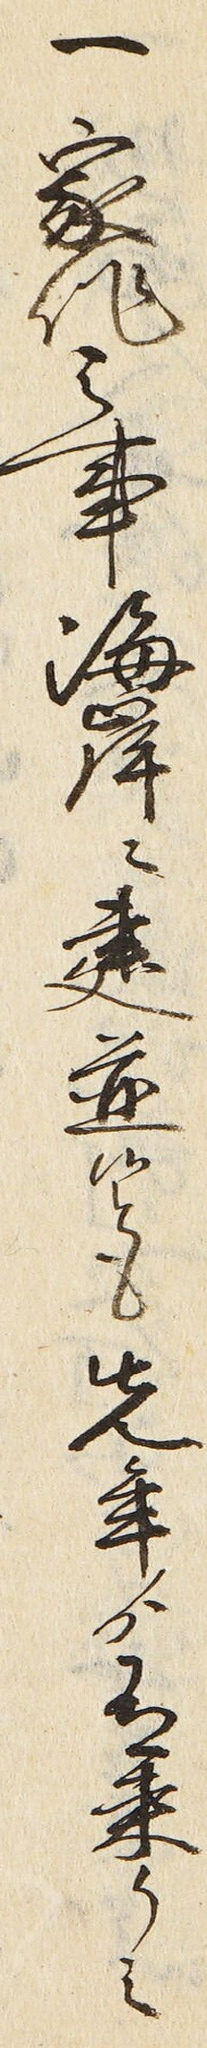一家作之事海岸に建並候とも先年ゟ有来り之
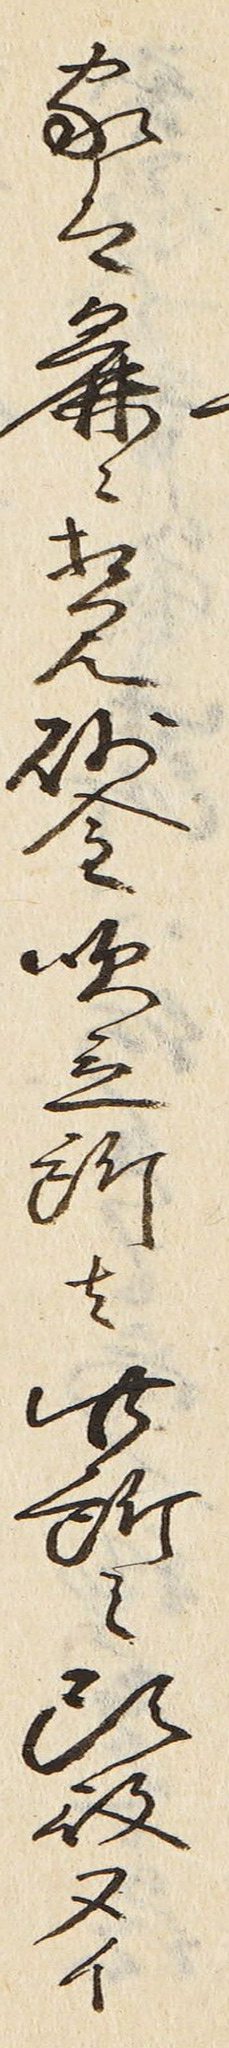家は麁に相見砂金吹立所は此所之頭役ヌイ
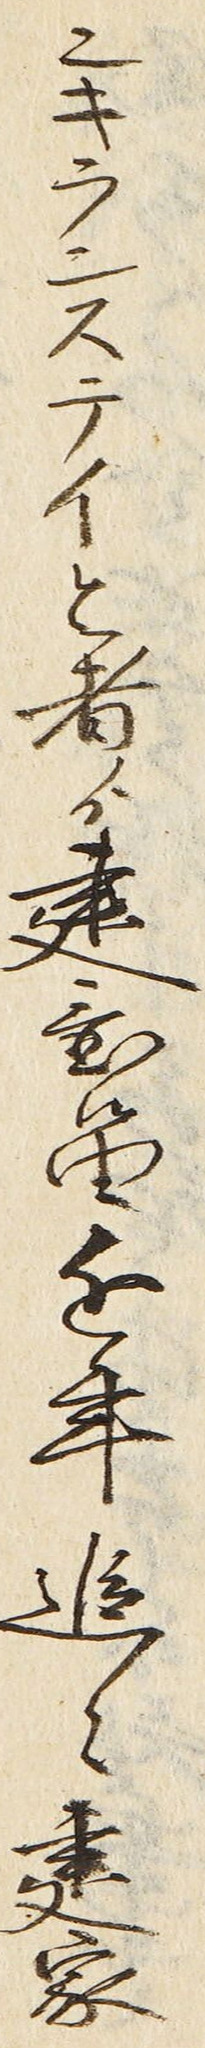ンキランステイと者ゟ建置候由近年追々建家
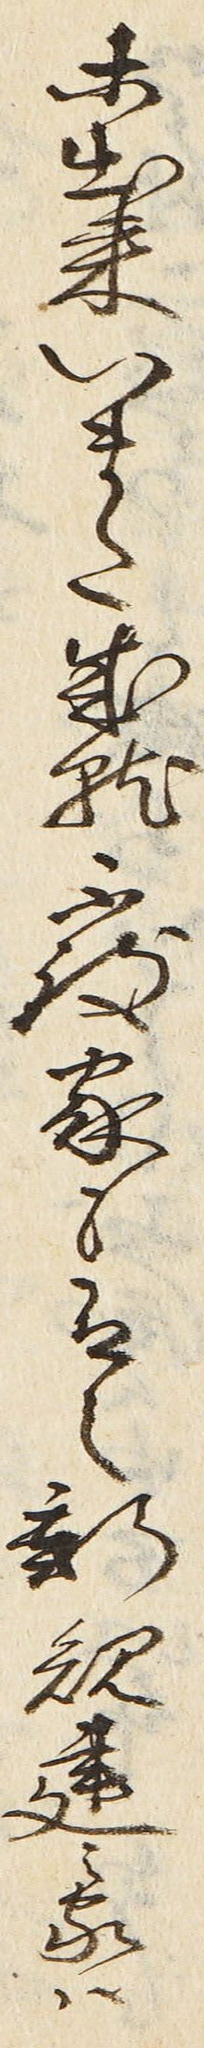等出来いまた成就不致家も有之新規建之家は
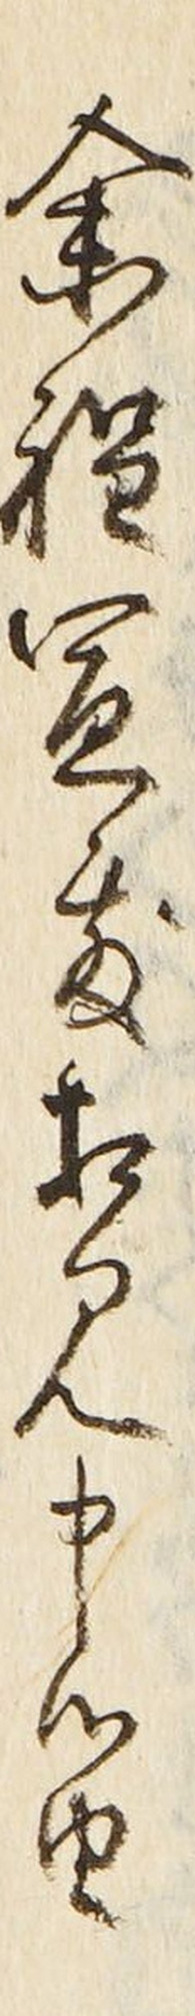余程宜敷相見申候由
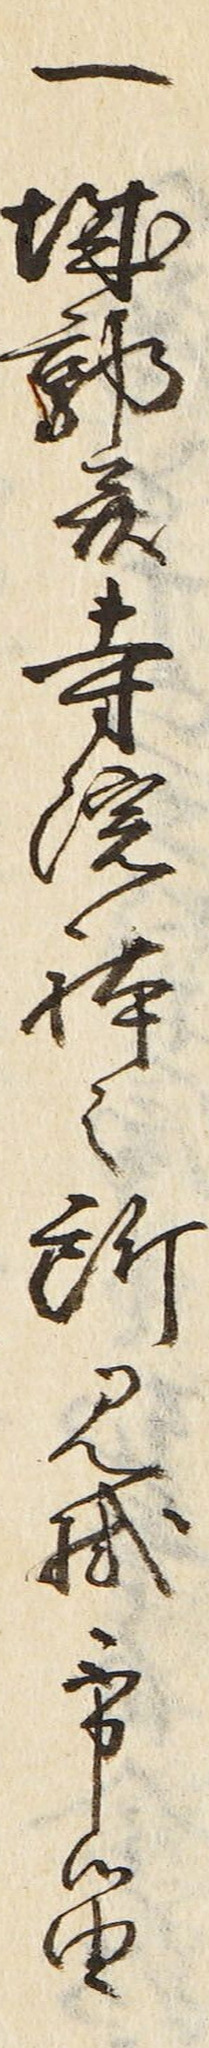一城郭并寺院躰之所見掛不申候由
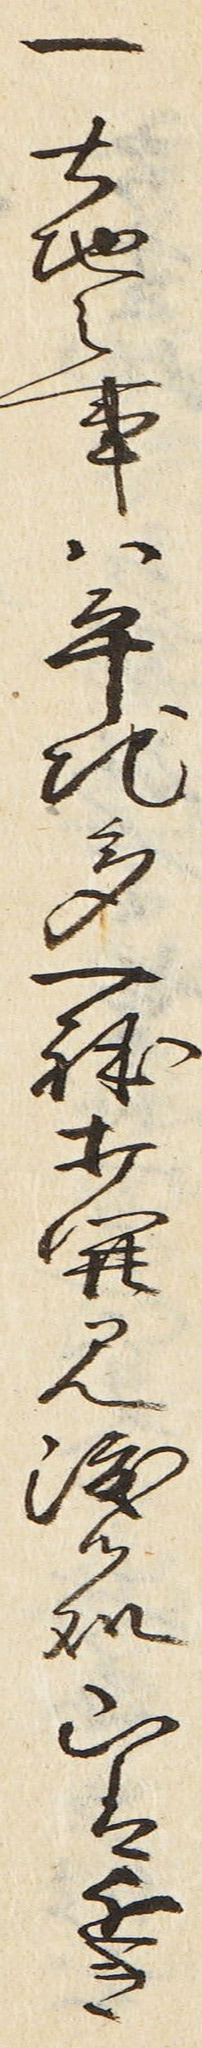一土地之事は平地多一躰打開見渡候処山は近き
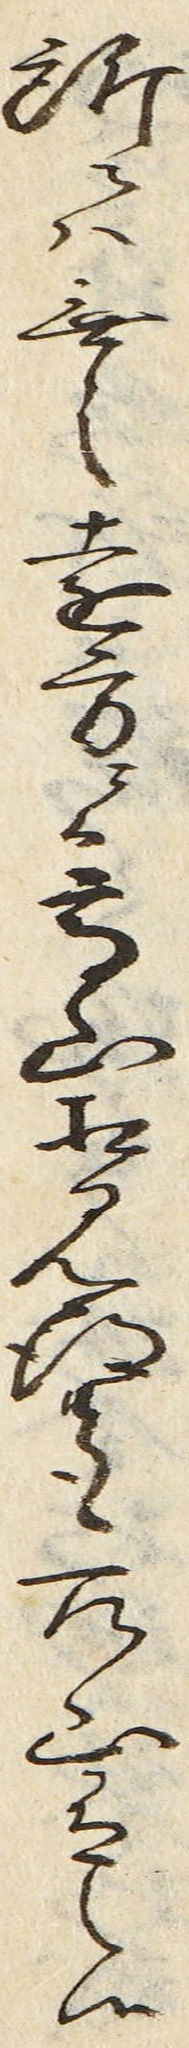所には無之遠方に而高山相見得候も兀山有之候
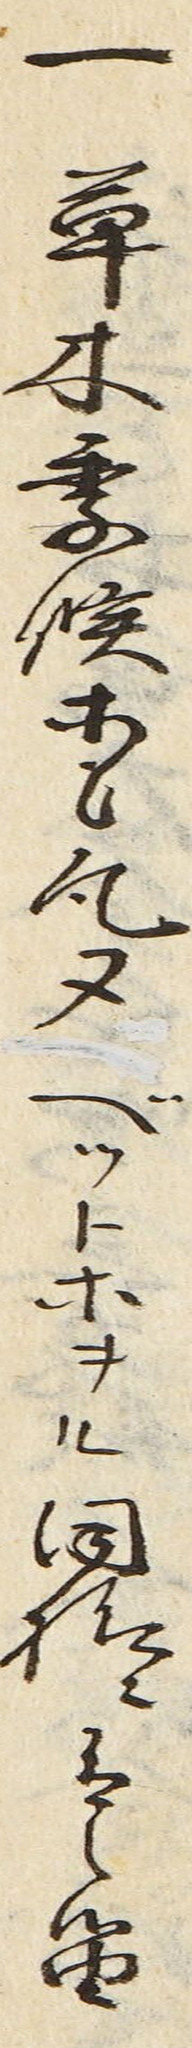一草木季候等も凡ヌべツトホヲル同様に有之候由
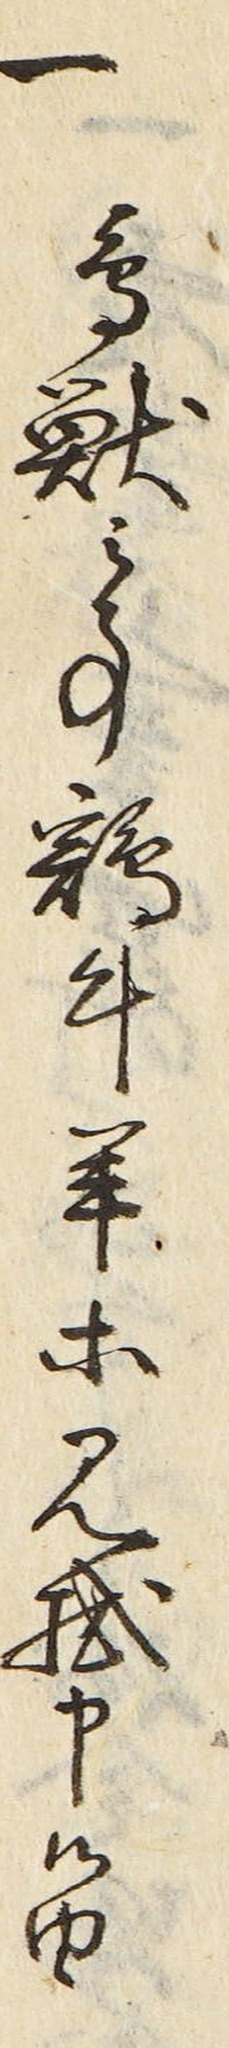一鳥獣之事鶏牛羊等見掛申候由

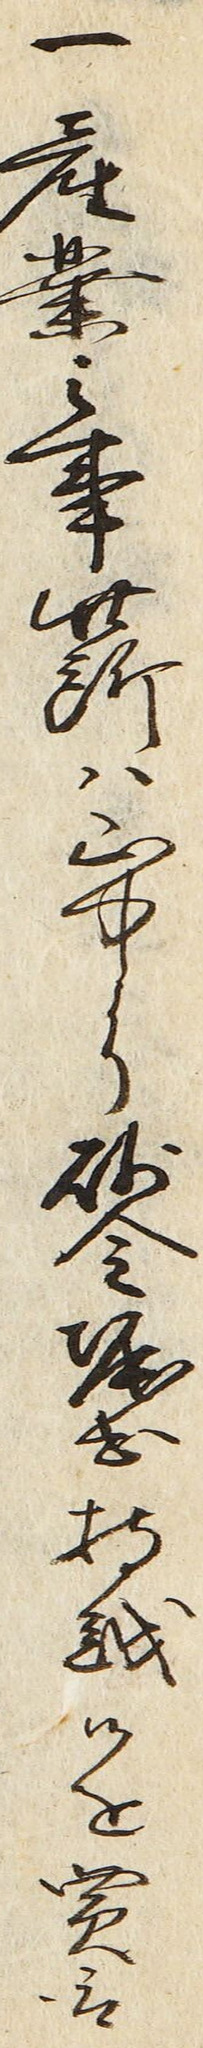一産業之事此所は山中より砂金掘出持越を買取
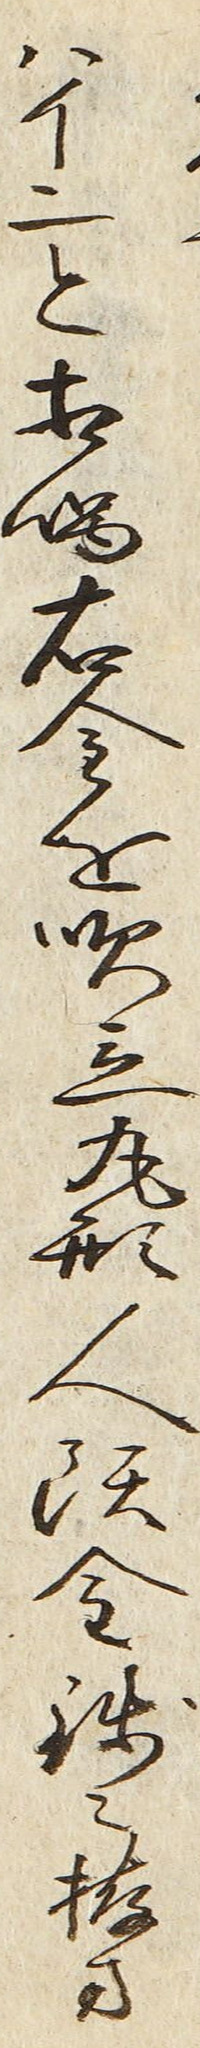ハインと相唱右金を吹立丸形人頭銭に拵方
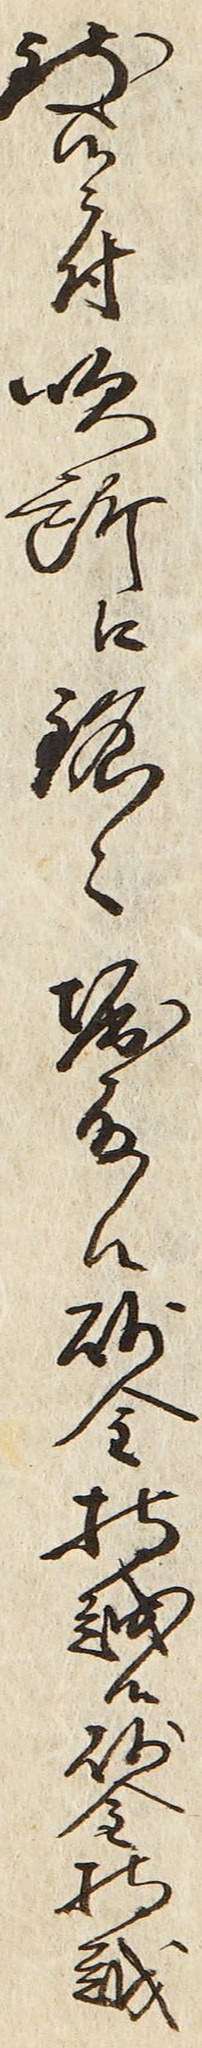致候に付吹所え銘々掘取候砂金持越候砂金持越
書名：土佐中浜万次郎漂流記
